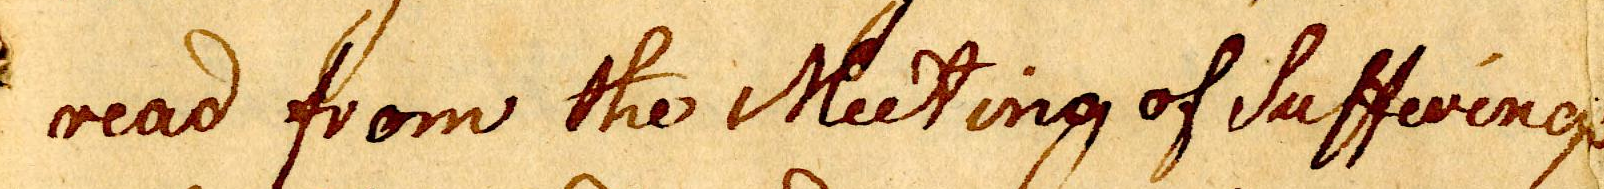read from the Meeting of Sufferings
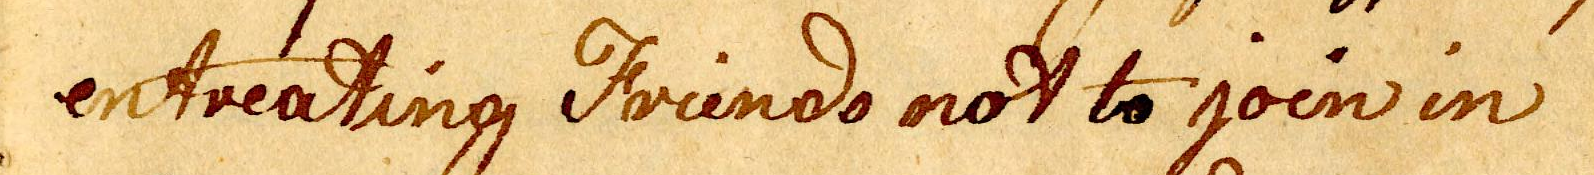entreating Friends not to join in
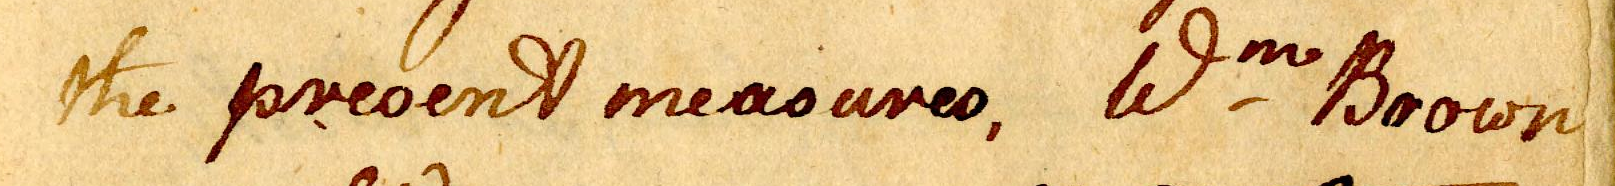the present measures, W^m Brown
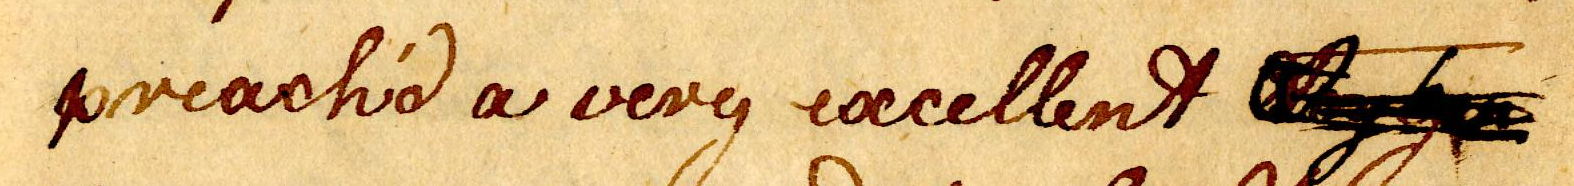preach'd a very excellent [______]
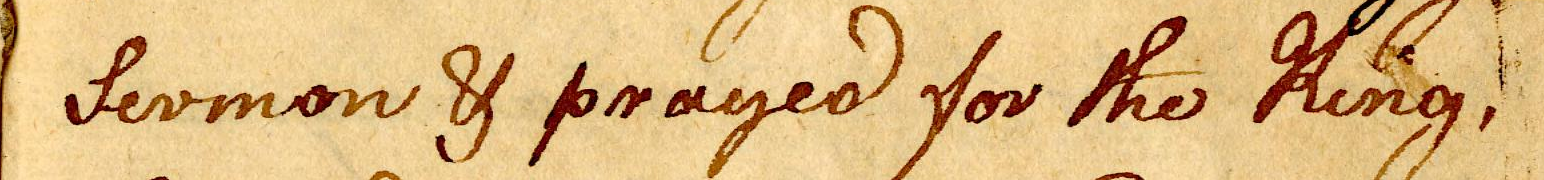Sermon & prayed for the King,
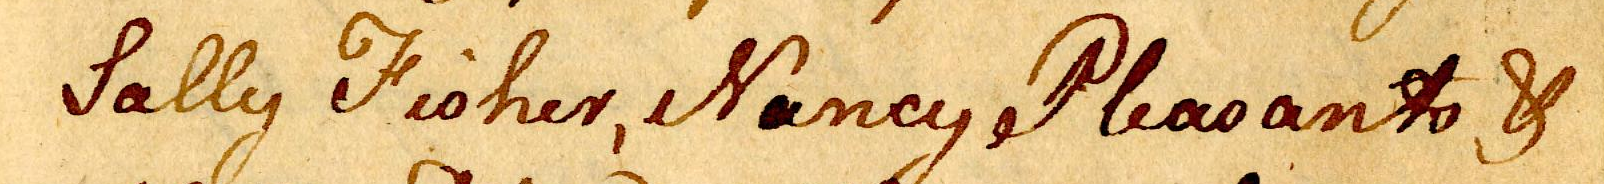Sally Fisher, Nancy Pleasants &
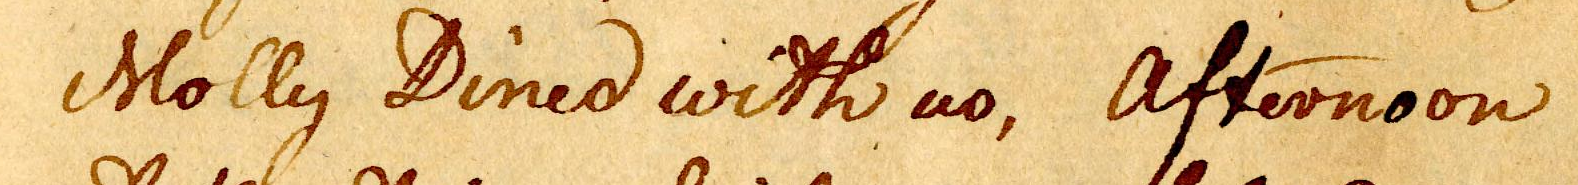Molly Dined with us, Afternoon
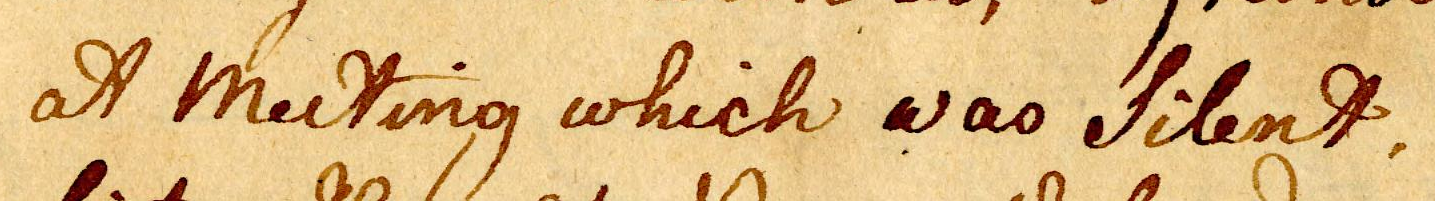at Meeting which was Silent,
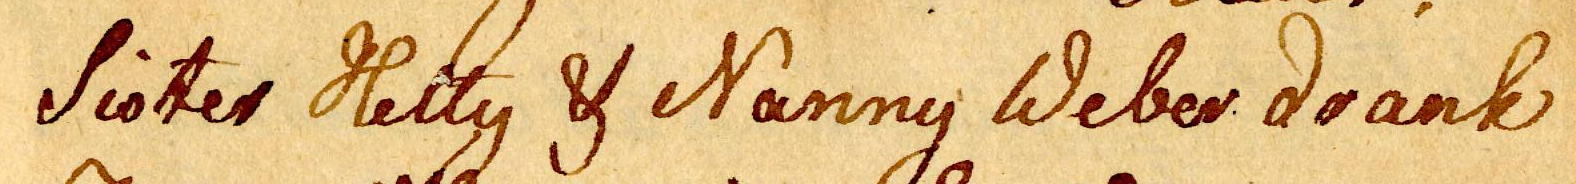Sister Hetty & Nancy Weber drank
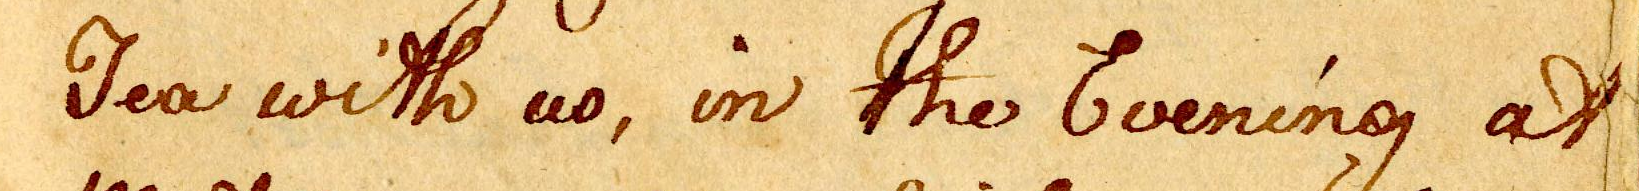Tea with us, in the Evening at
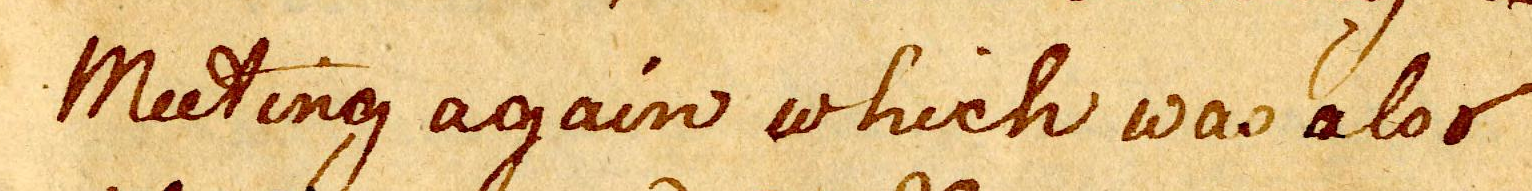Meeting again which was a lot
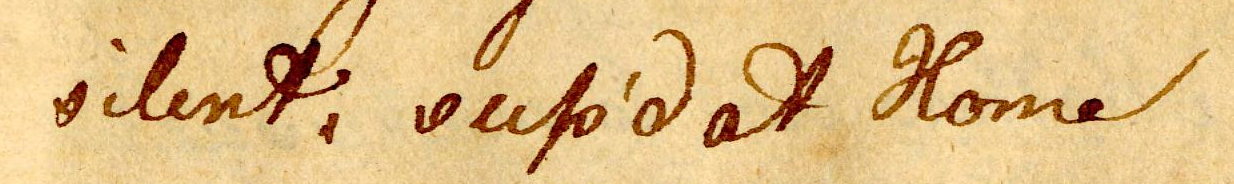silent, sup'd at Home
